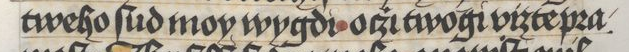tweho ſud moy wygi.ocżi twogi vizte pra¬
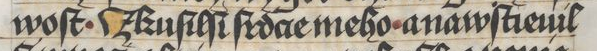woſt.Zkuſilſi ſrdcie meho.a nawẛtievil
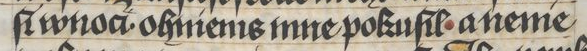ſi wnoci.ohniems mne pokuſil.a neníe
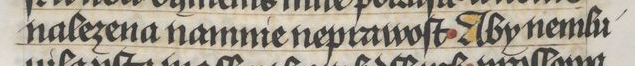nalezena namnie neprawoſt.Aby nemlu¬
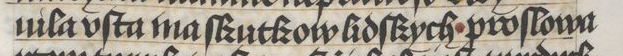vila uſta ma ſkutkow lidſkych.proſlowa
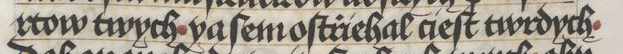rtow twych.yaſem oſtṙiehal cieſt twrdych.
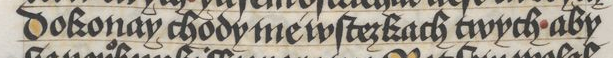Dokonay chody mé wſtezkach twych.aby
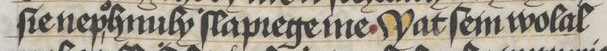ſie nepohnuly ẛlapiege me.Yat ſem wolal
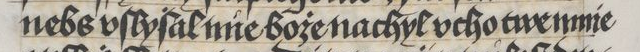Nebs uſlyẛal mie bože nachyl ucho twe umie
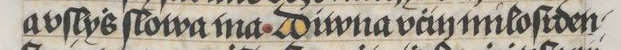a uſlyṡ ſlowa ma.Diwna uċin miloſrden¬
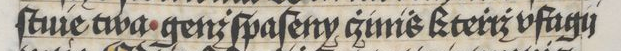ſtwíe twa.genż ſpaſeny cżiníṡ kteṙiż ufagij
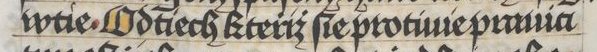wtie.Odtiech kteṙíż ſie protivie pravici
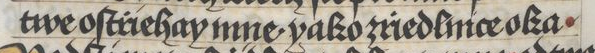twe oſtṙiehay mne. yako zṙiedlnice oka.
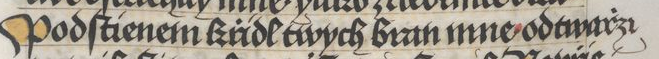Pod ſtíenem kṙidl twych bran mne.odtwarżi
